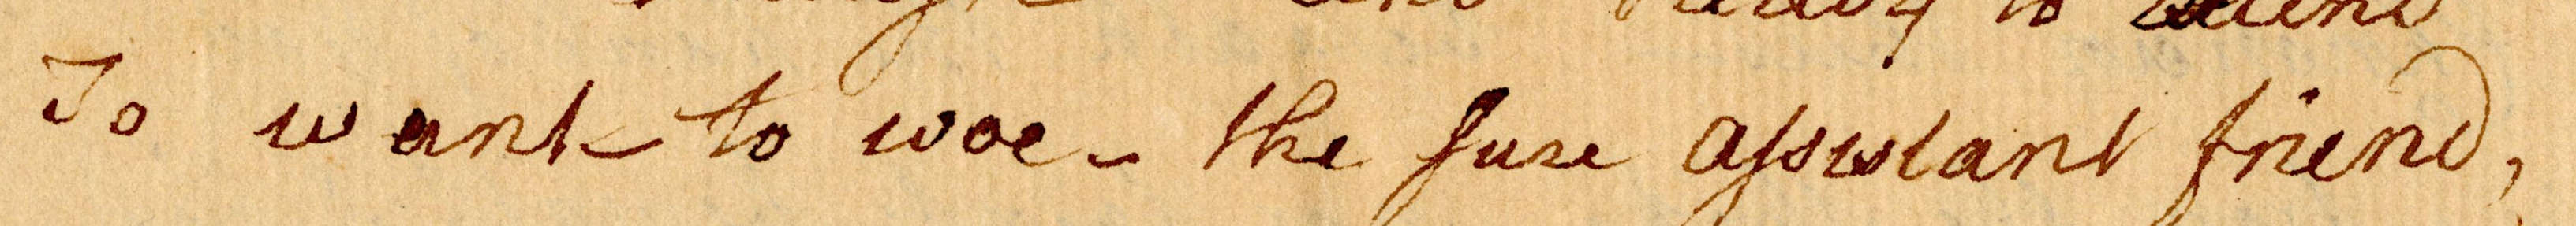To want- to woe- the sure assistant friend,
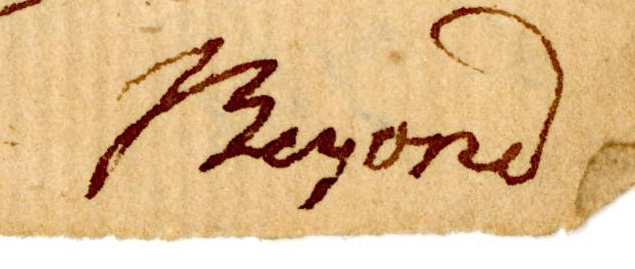Beyond
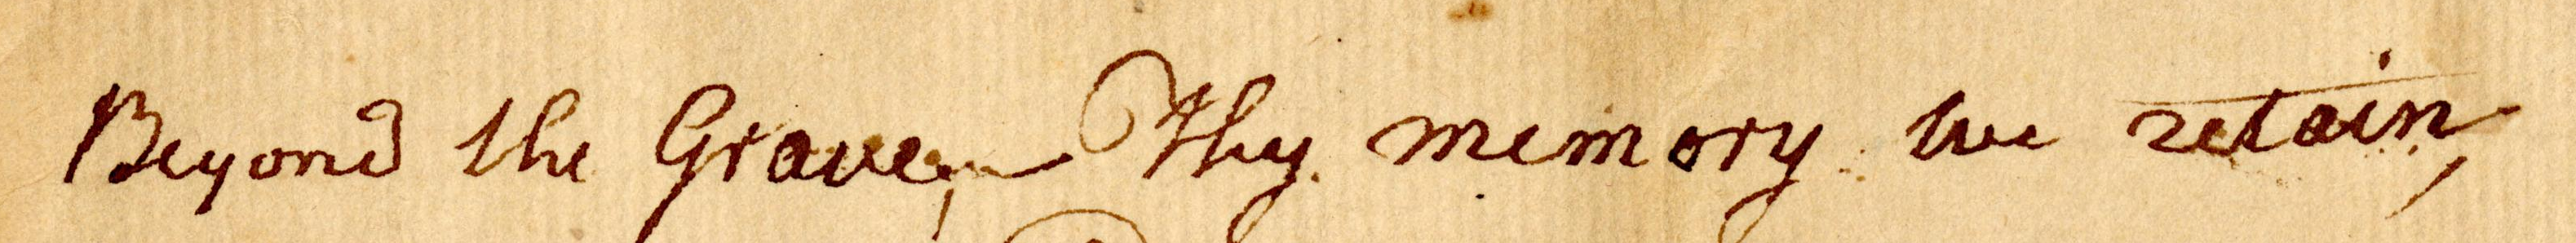Beyond the Grave- Thy memory we retain,
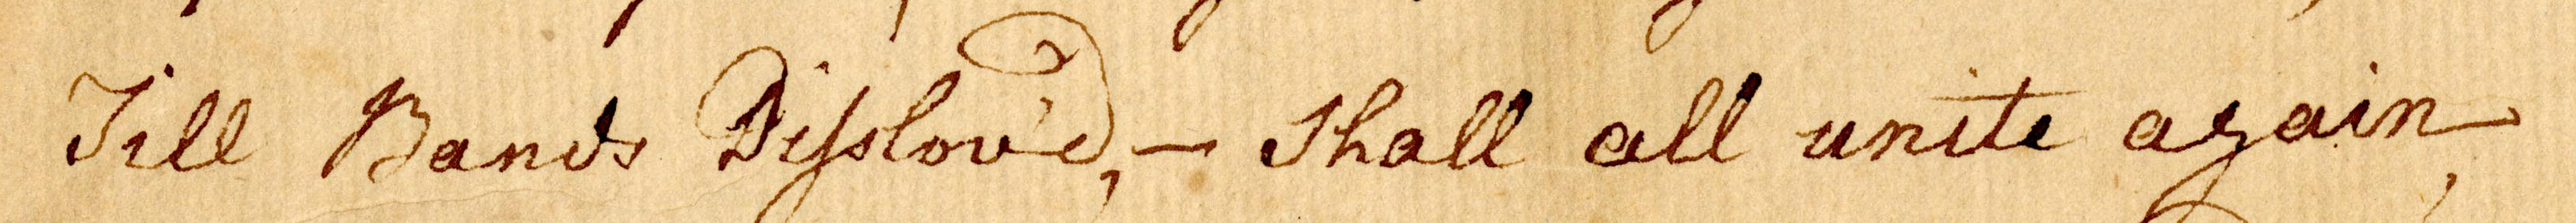Till Bands Disslov'd,- shall all unite again
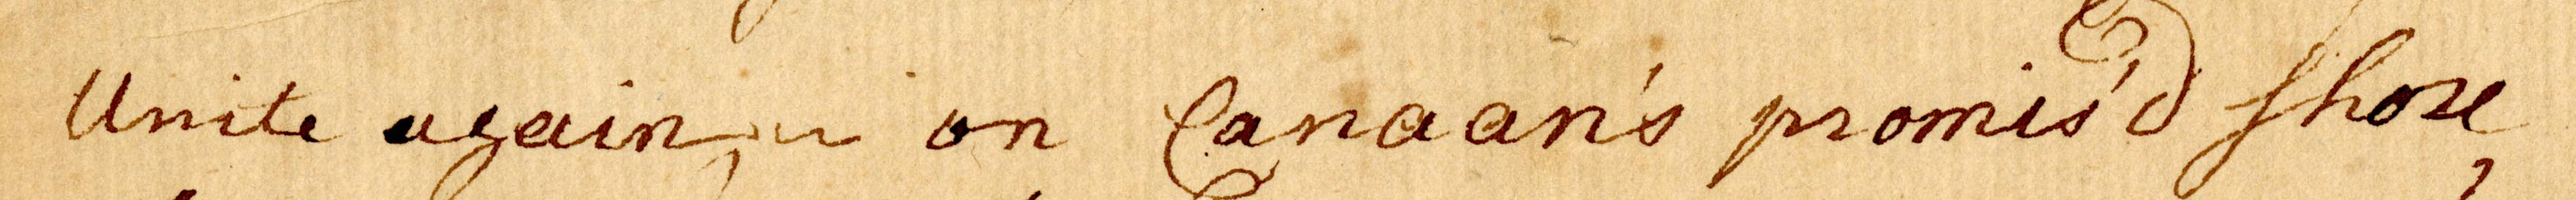Unite again,- on Canaan's promis'd shore,
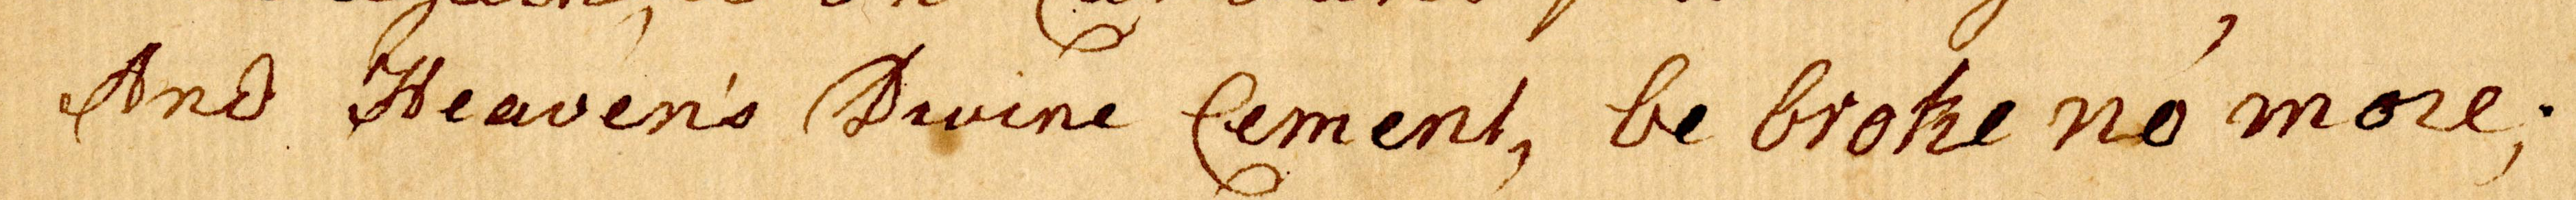And Heaven's Divine Cement, be broke no more;
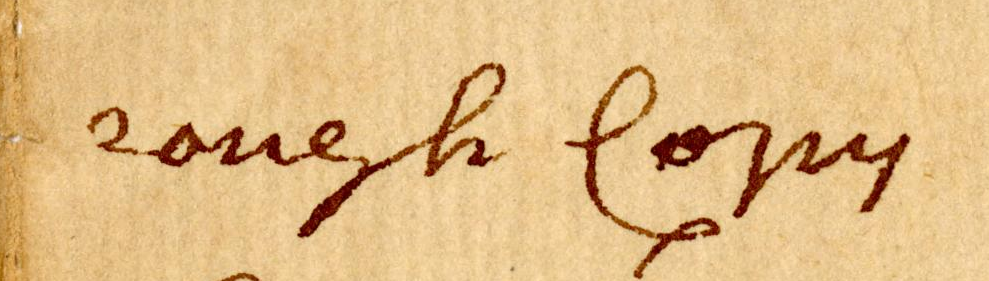rough Copy
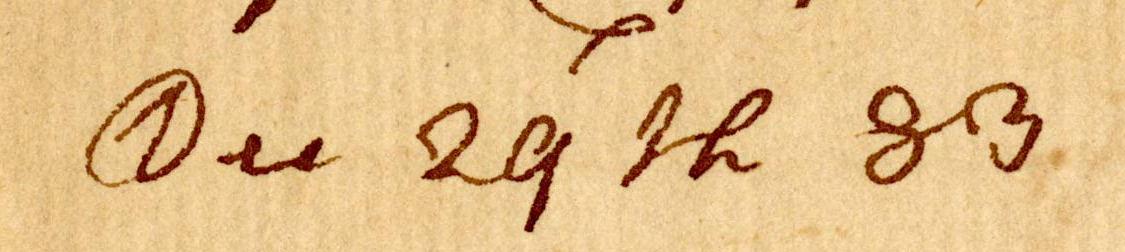Dec 29th 83
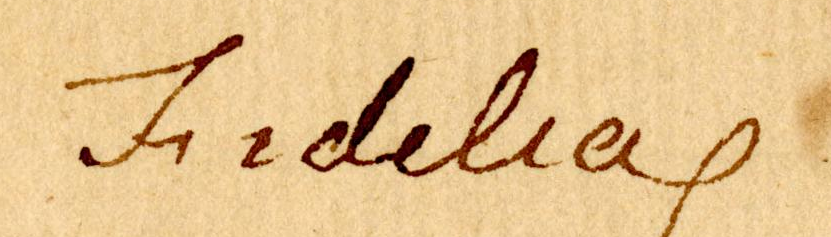Fidelia
